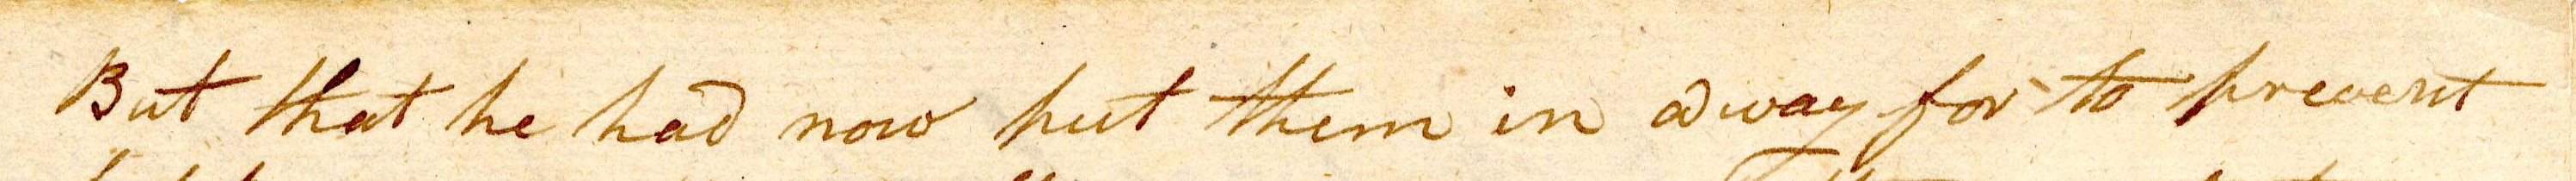But that he had now put them in away for to prevent
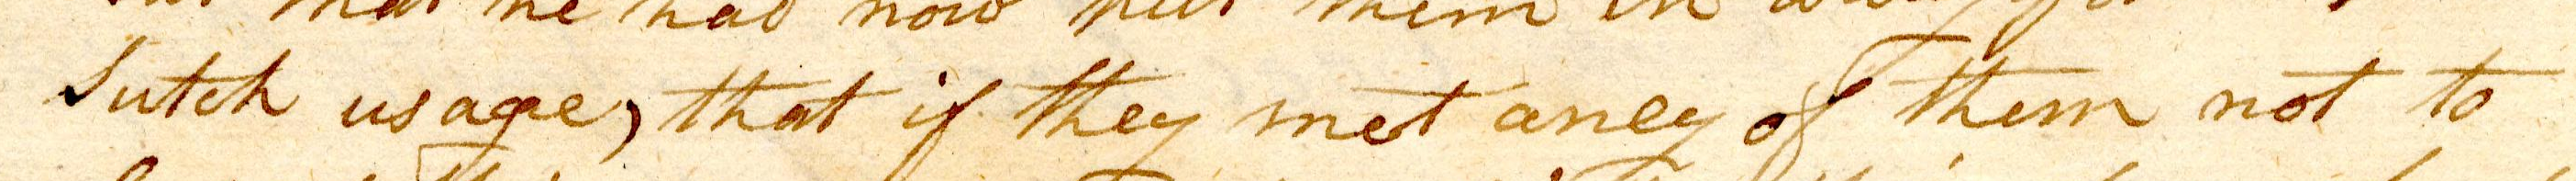Sutch usage, that if they met aney of them not to
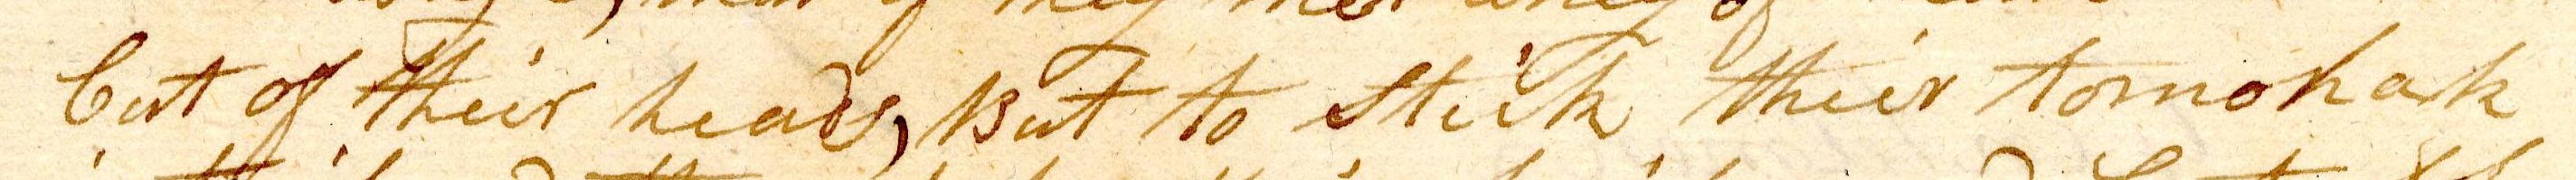Cut of their heads, But to stick their tomohak
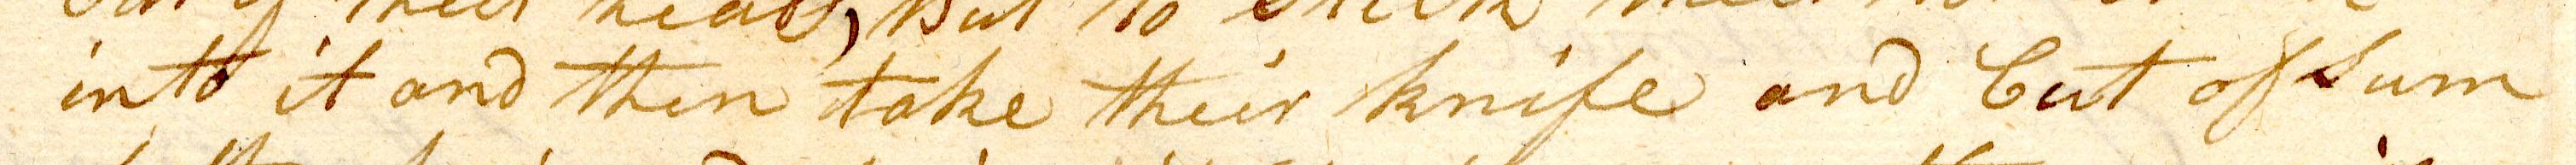into it and then take their knife and Cut of Sum
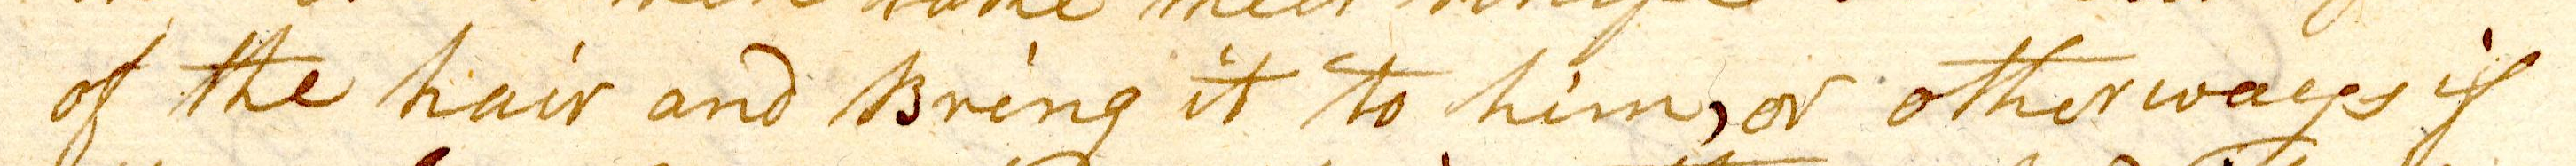of the hair and Bring it to him, or other ways if
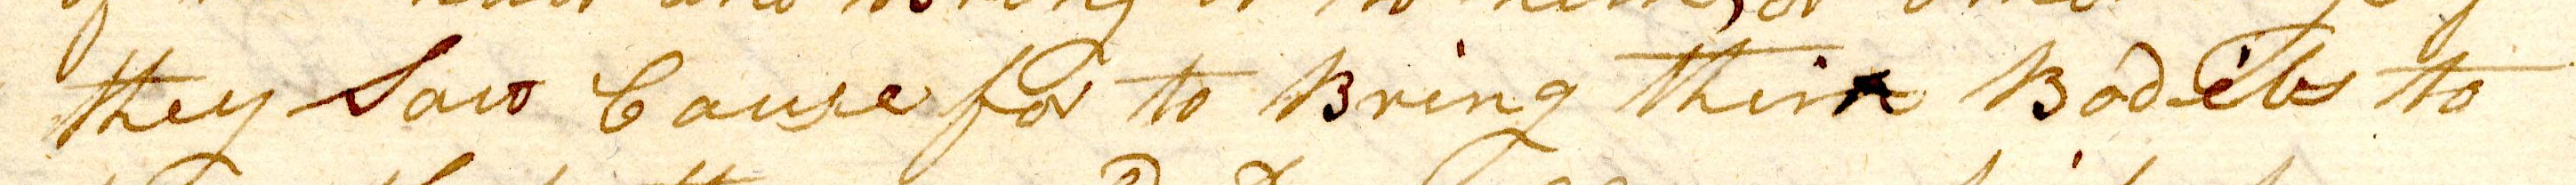they Saw Cause for to Bring their Bodies to
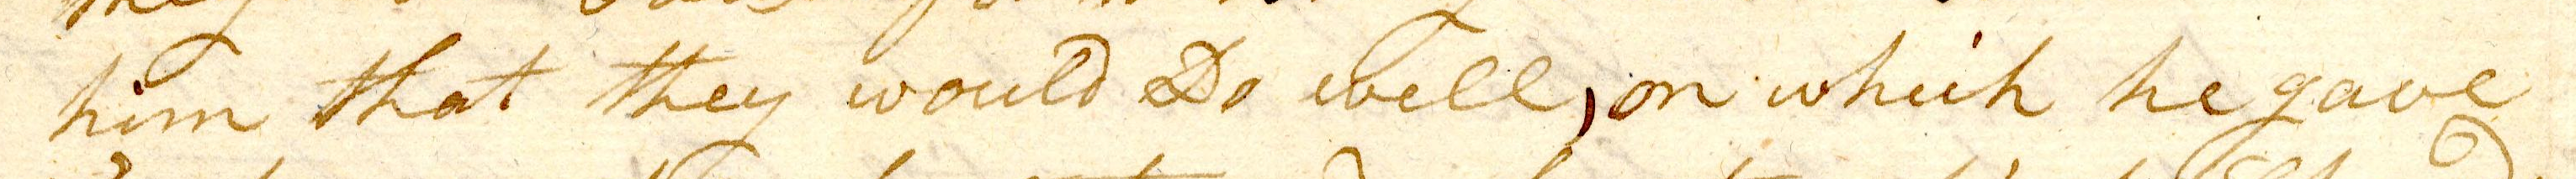him that they would Do well, on which he gave
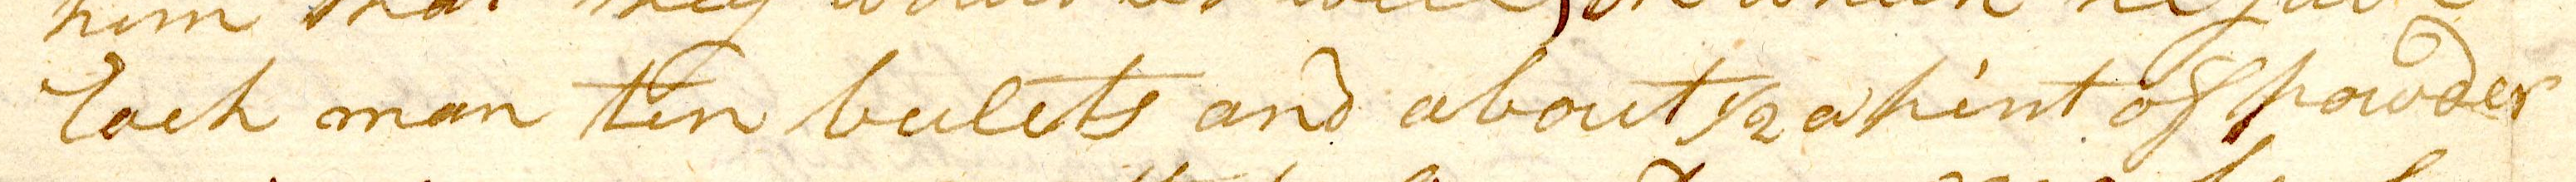Each man ten bulets and about 1/2 a pint of powder
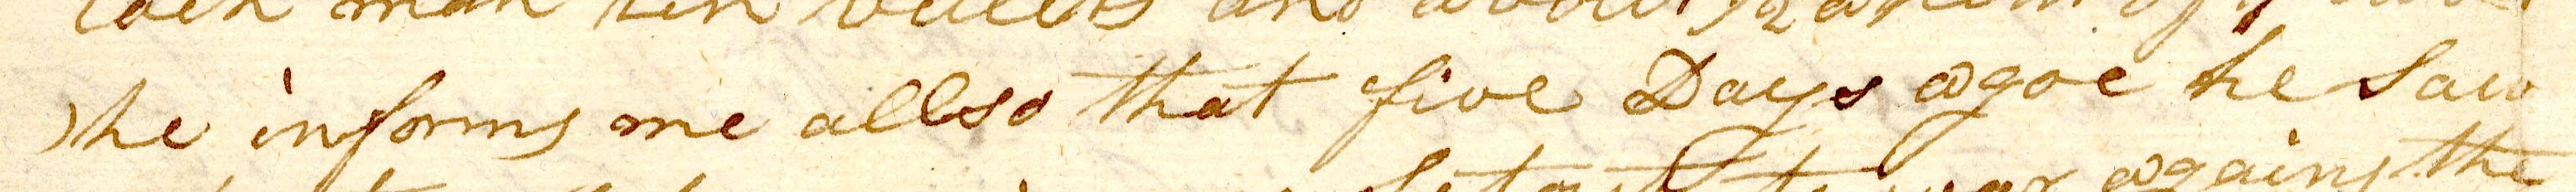he informs me allso that five Days agoe he saw
